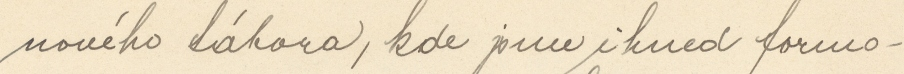nového tábora, kde jsme ihned formo-
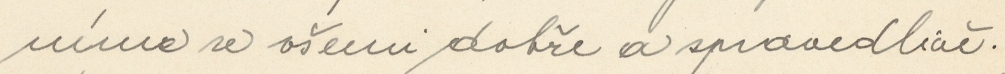níme se všemi dobře a spravedlivě.
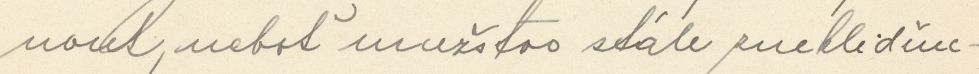nout, neboť mužstvo stále zneklidňu-
